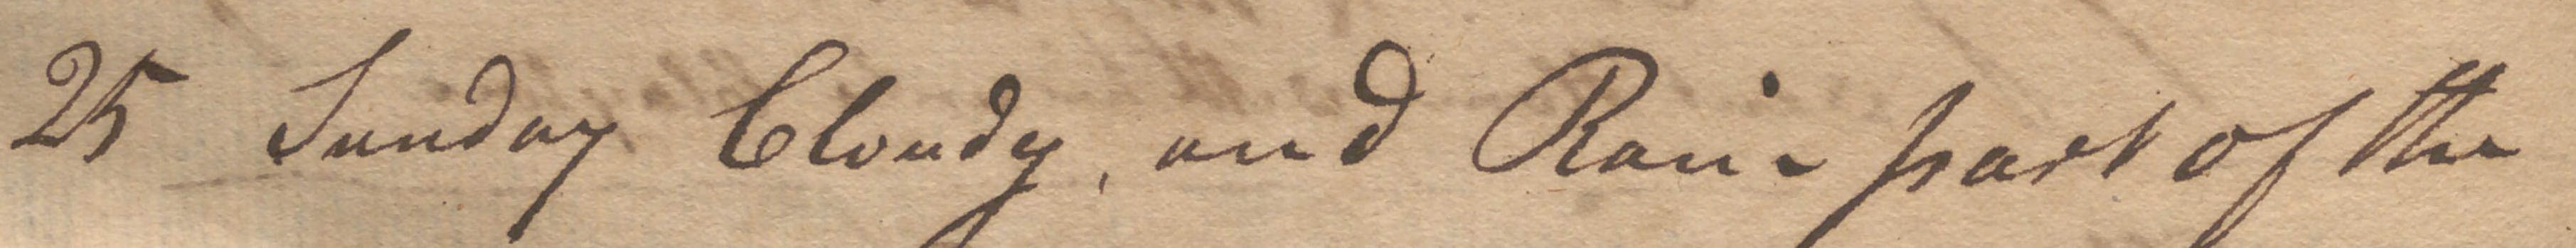25 Sunday Cloudy, and Rain part of the
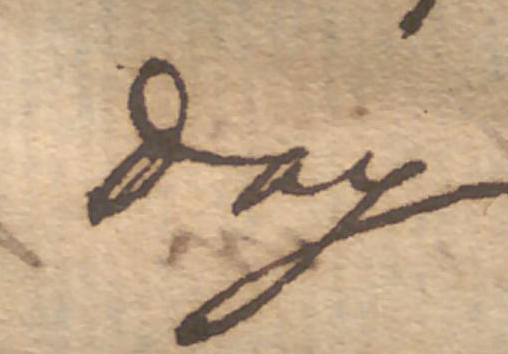day
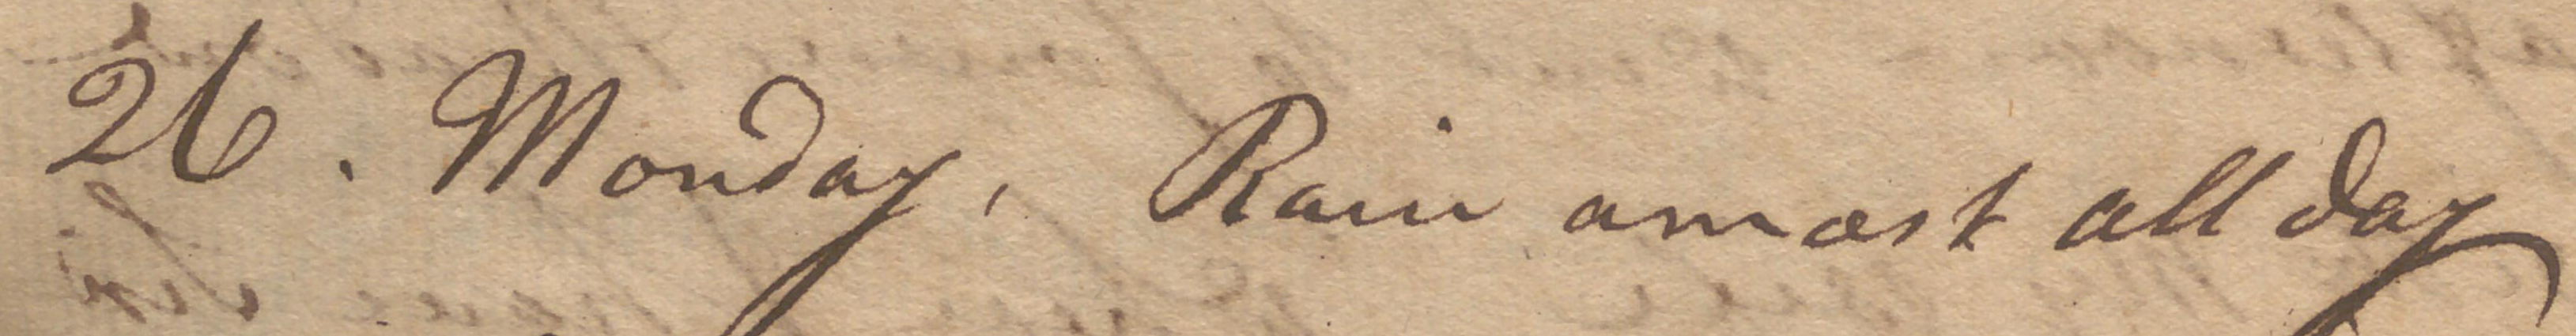26. Monday. Rain amost all day
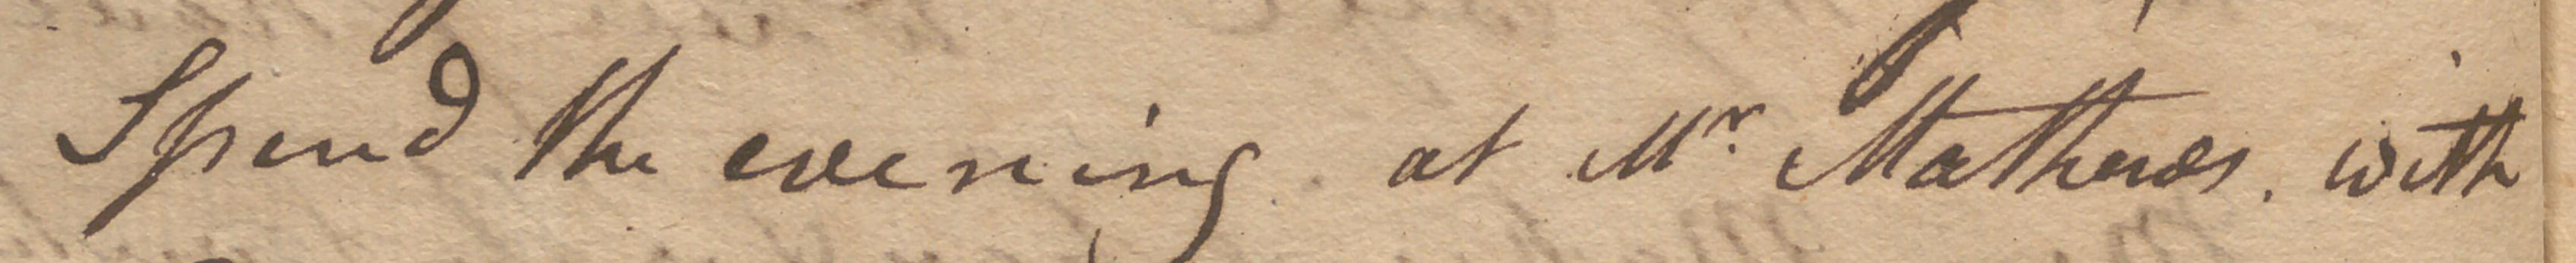spend the evening at M^r. Mathews, with
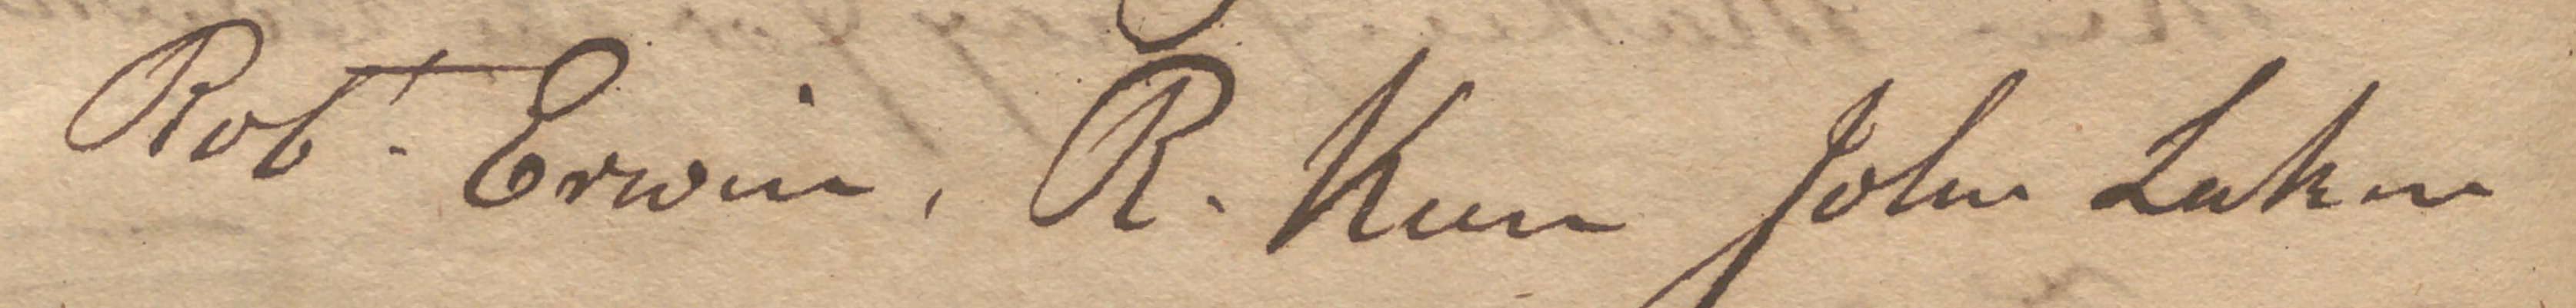Rob^t. Erwin, R. Kun John Lukens
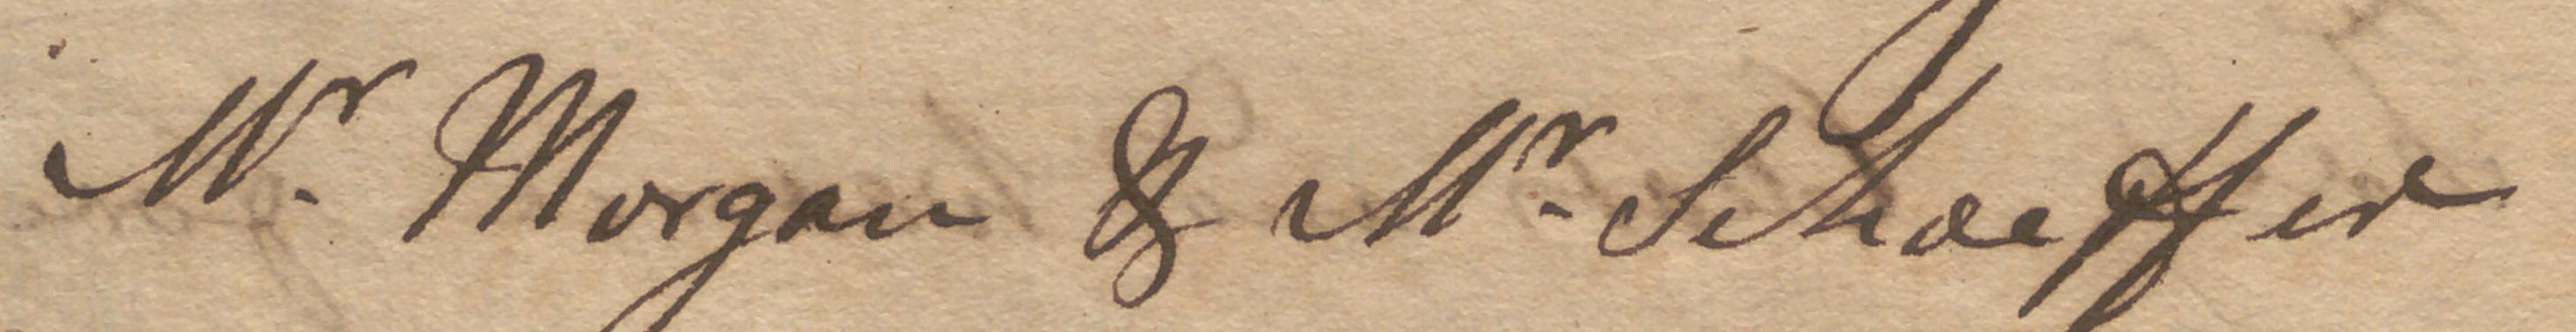M^r. Morgan & M^r. Schaeffer
